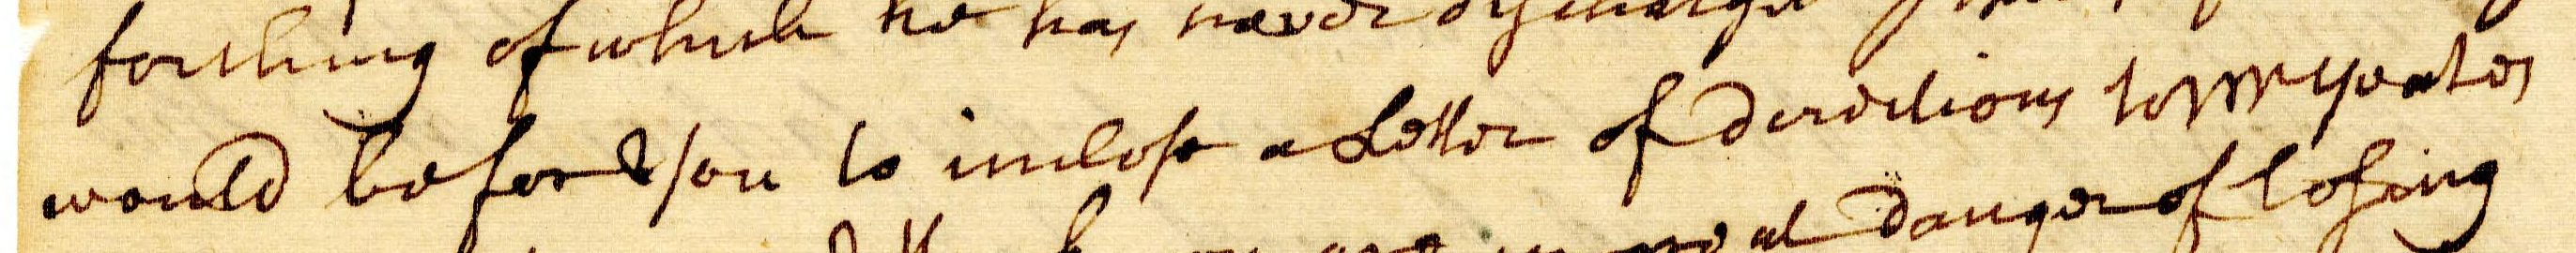would be for You to inclose a Letter of directions to M^r Yeates
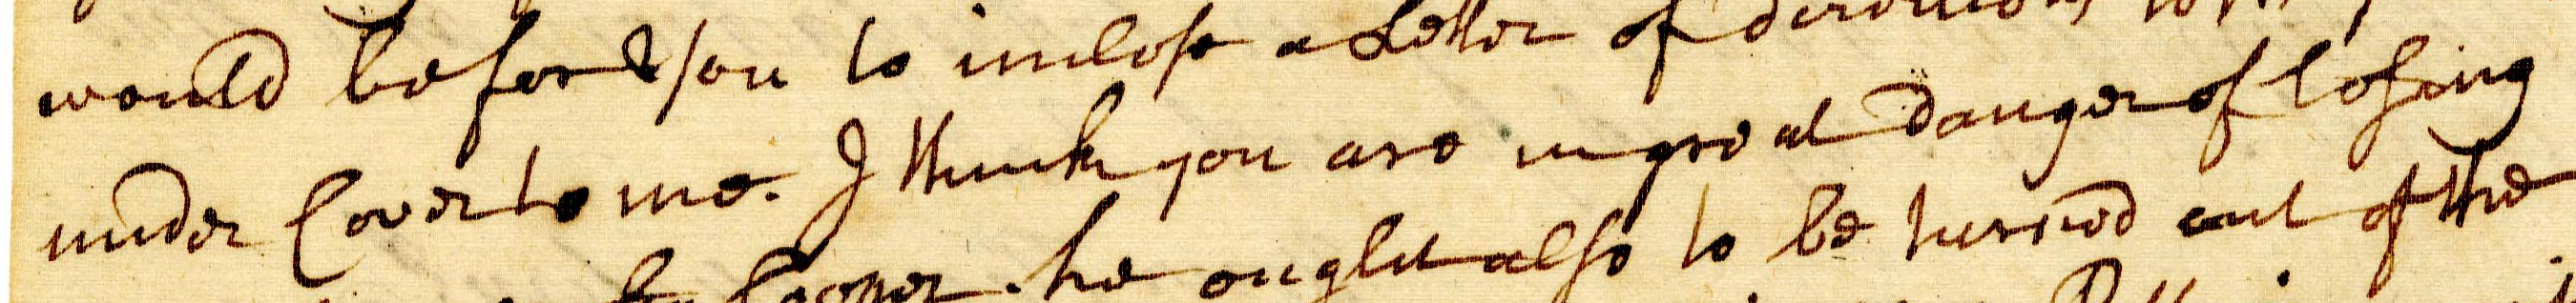under Cover to me. I think you are in great danger of losing
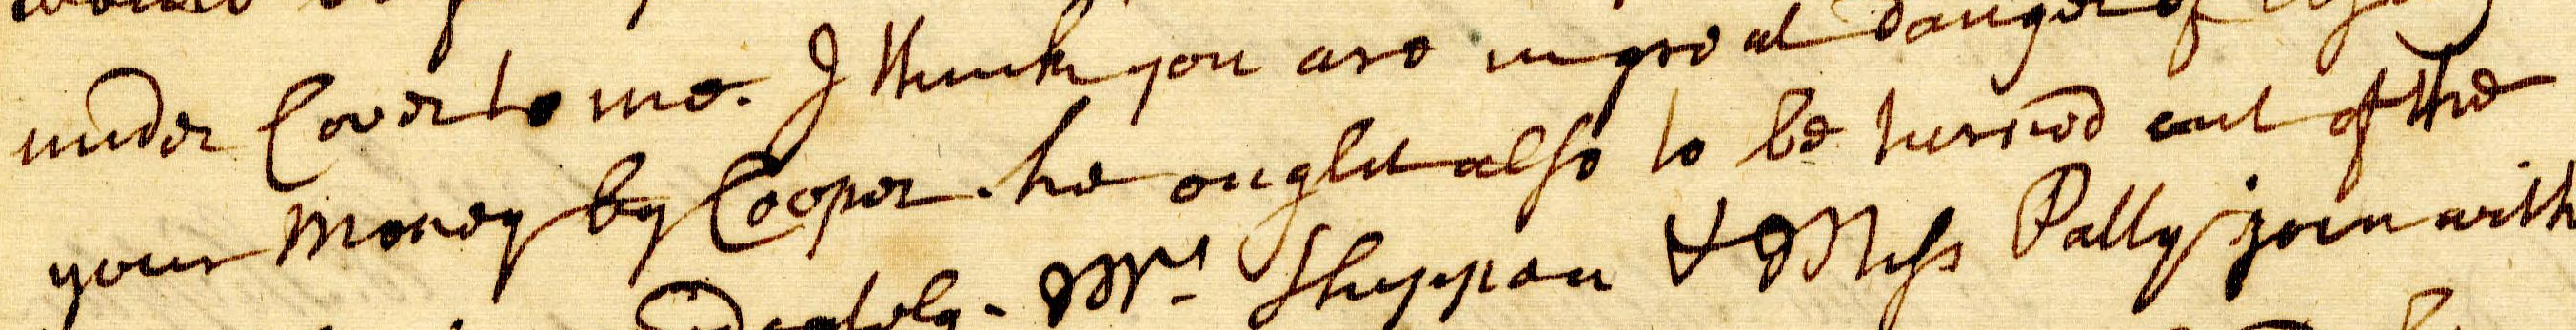your Money by Cooper. he ought also to be turned out of the
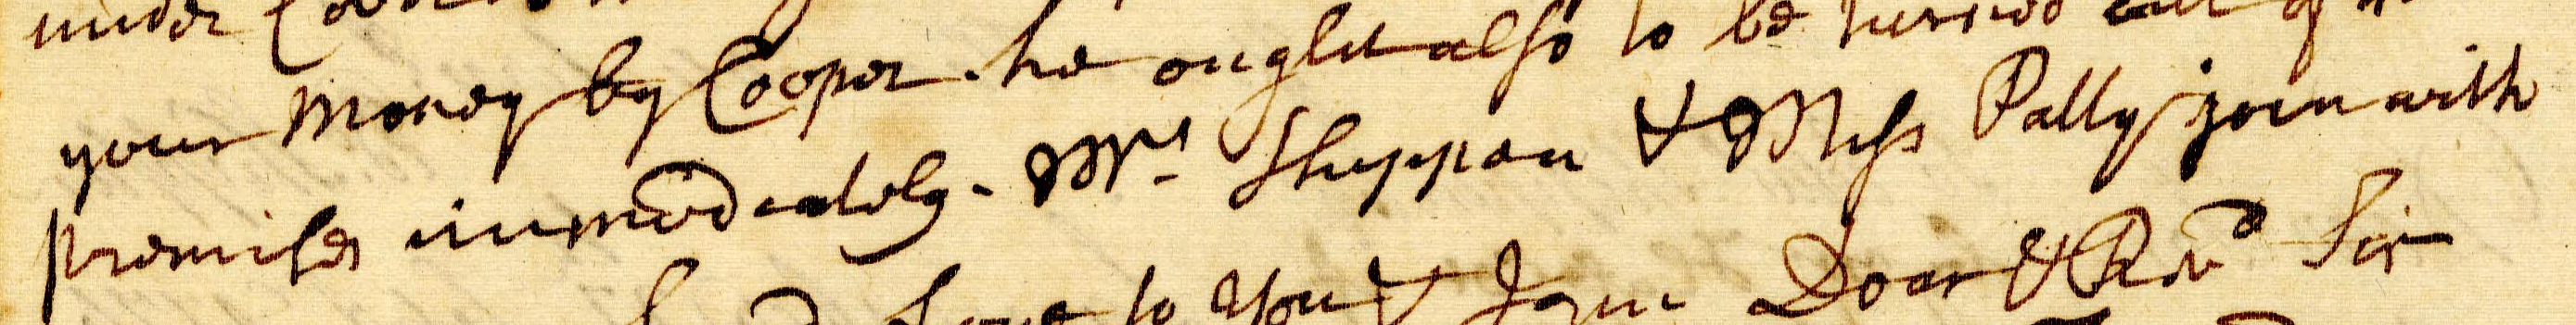premises immediately. M^rs. Shippen & Miss Patty join with
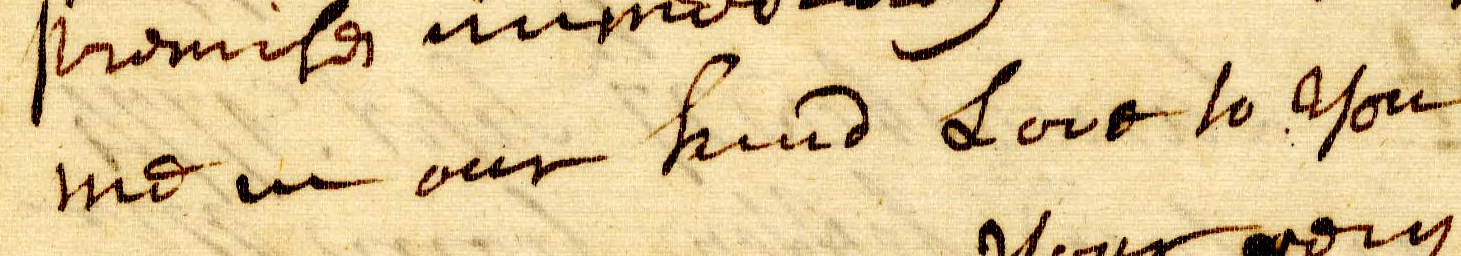me in our kind Love to You
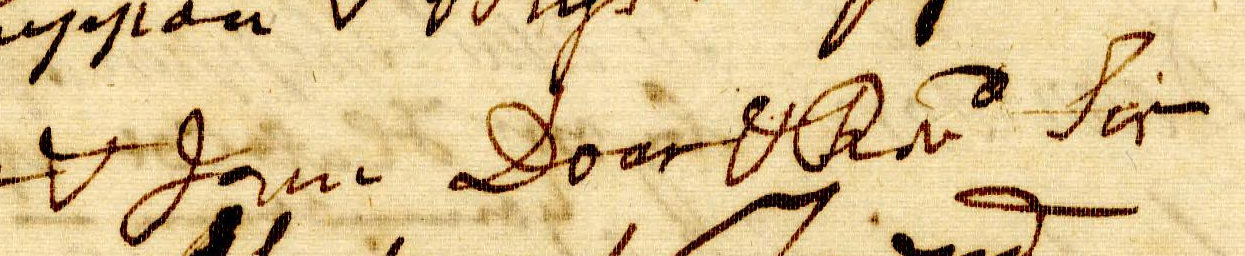& I am Dear & Rev^d Sir
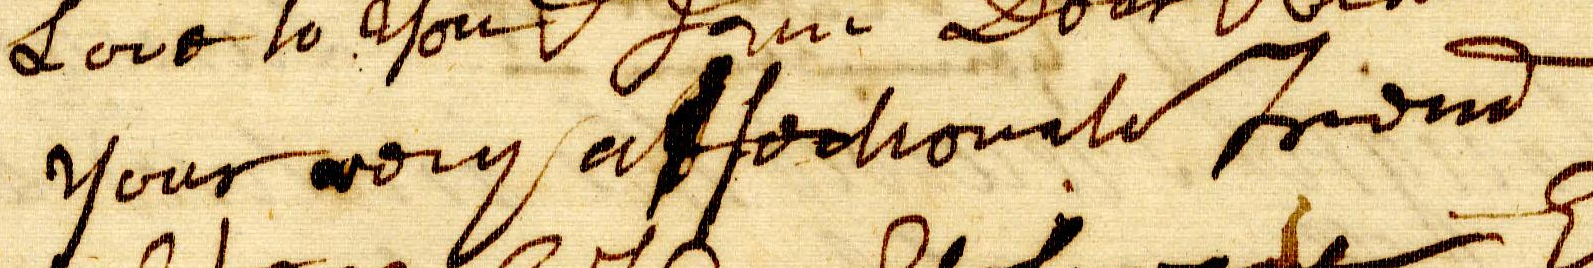Your very affectionate Friend
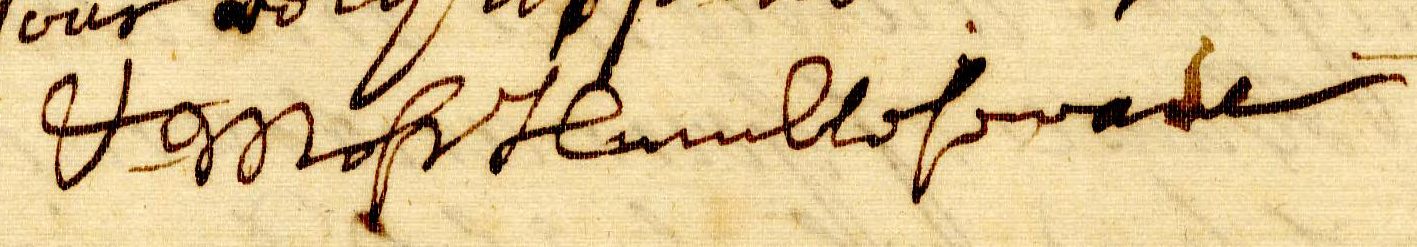& Most Humble Servant
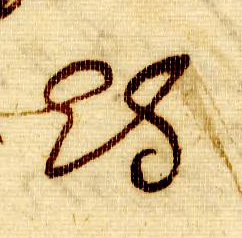ES
